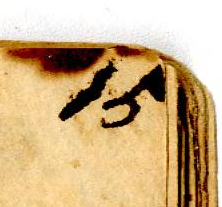15
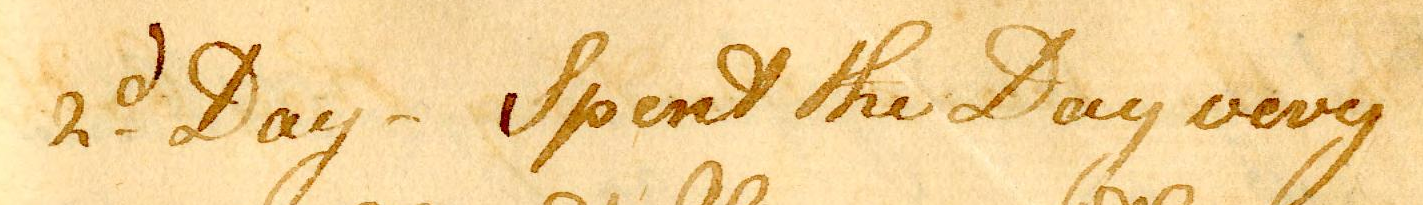2^d. Day- Spent the Day very
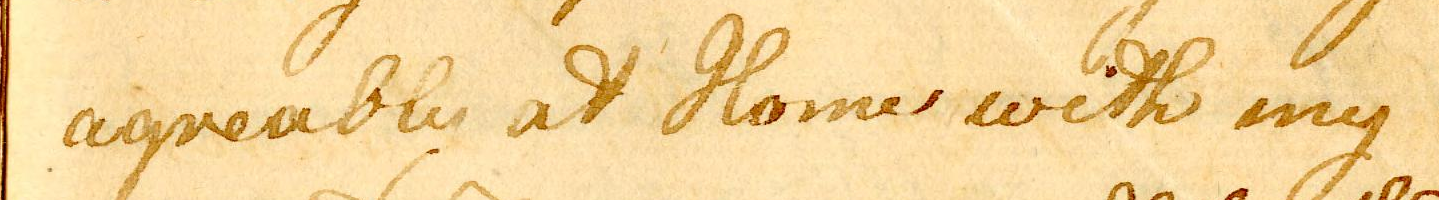agreably at Home with my
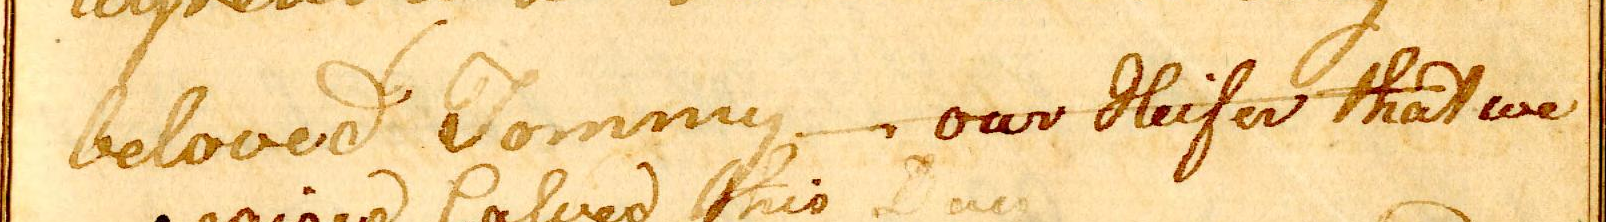beloved Tommy- our Heifer that we
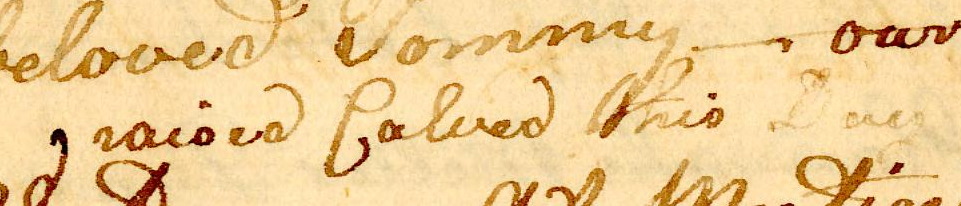raised Calved this Day
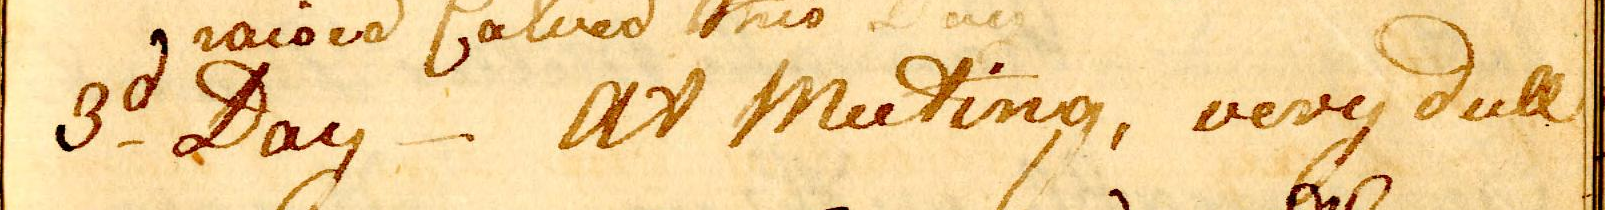3^dDay- At Meeting, very dull
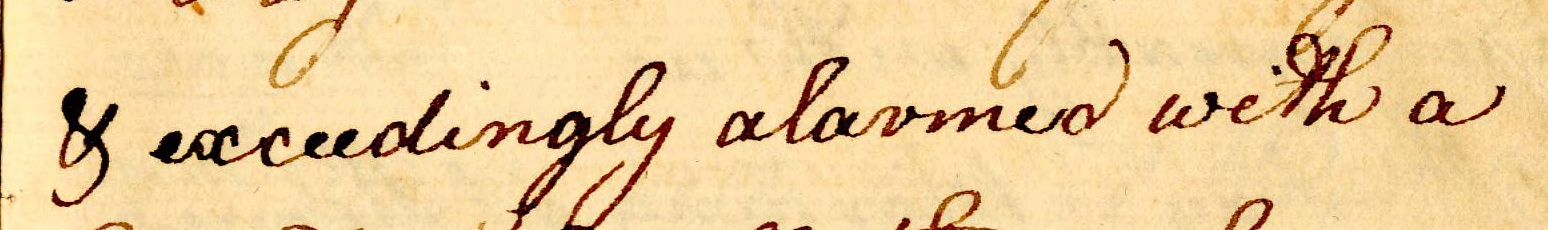& exceedingly alarmed with a
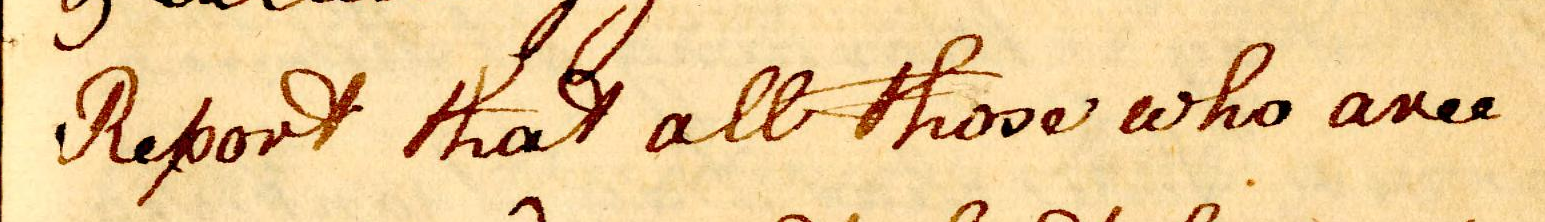Report that all those who aree
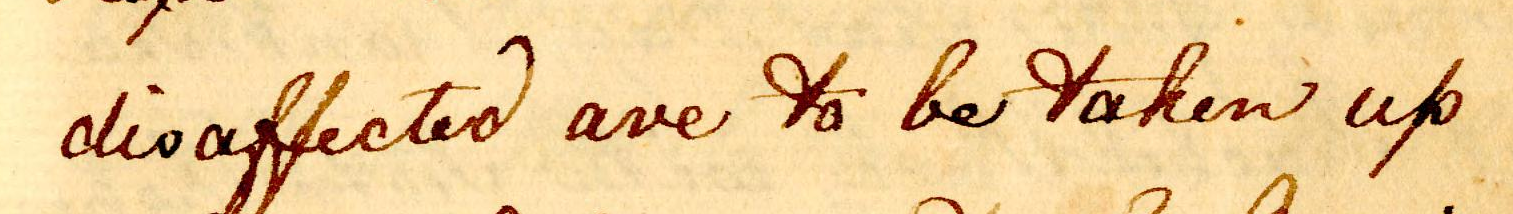disaffected are to be taken up
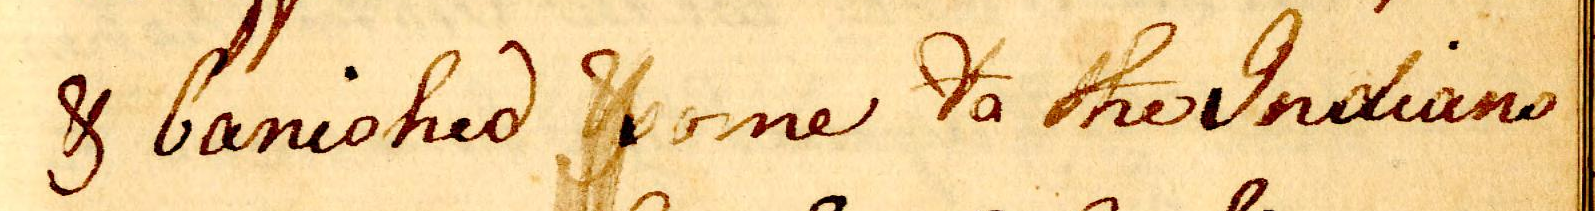& banished & some to the Indians
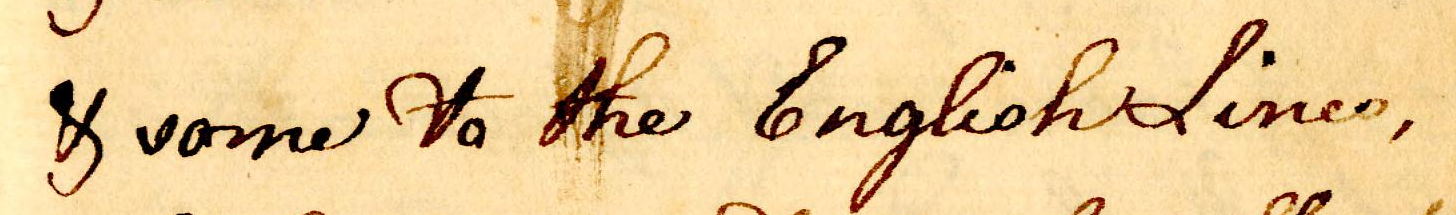& some to the English Lines,
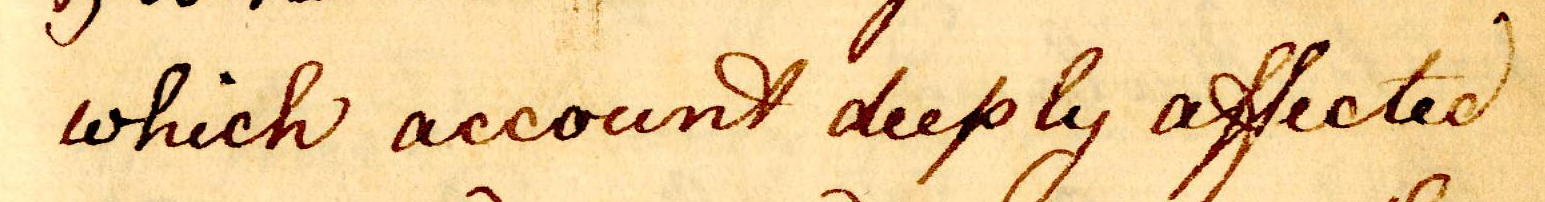which account deeply affected
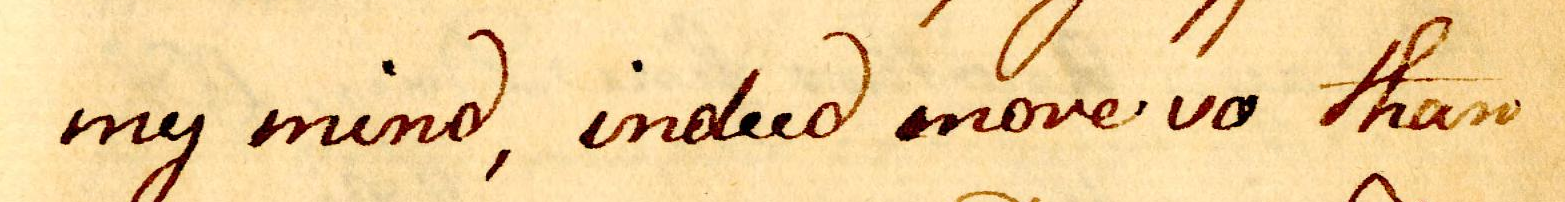my mind, indeed more so than
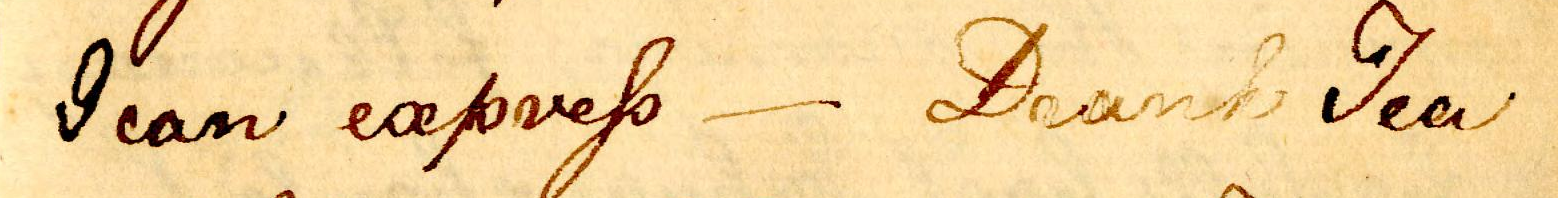I can express- Drank Tea
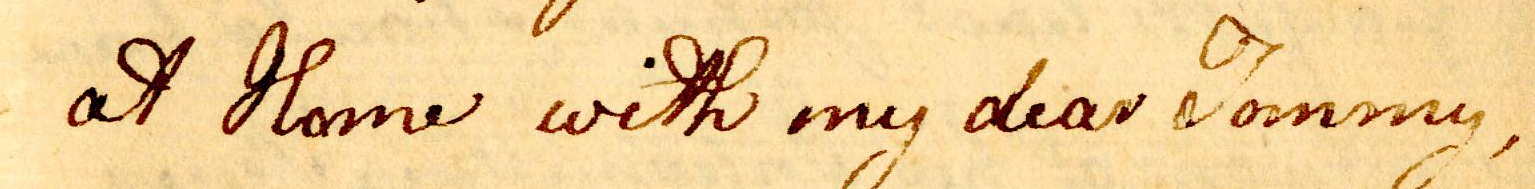at Home with my dear Tommy,
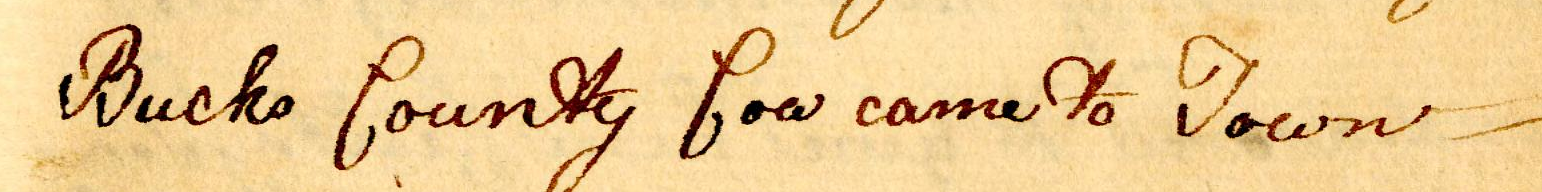Bucks County Cow came to Town
